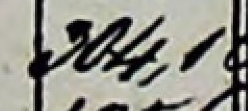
304,1
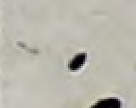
.
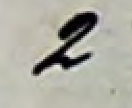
2
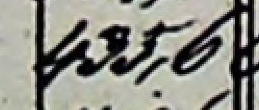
435,6
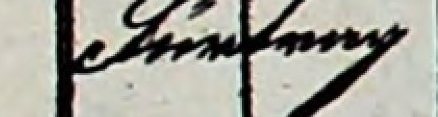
Sönntrag
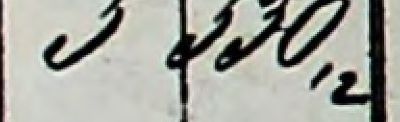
5 536,2
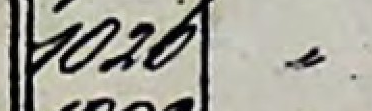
1026 „
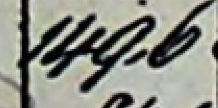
149,6
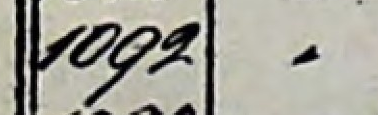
1092 „
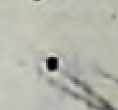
.
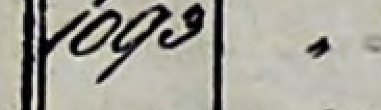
1093 „
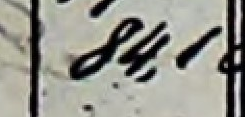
84,1
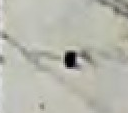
.
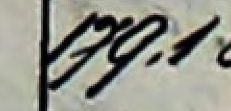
179,1
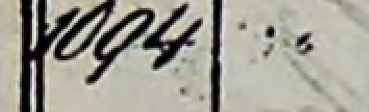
1094 „
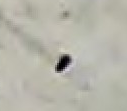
.
